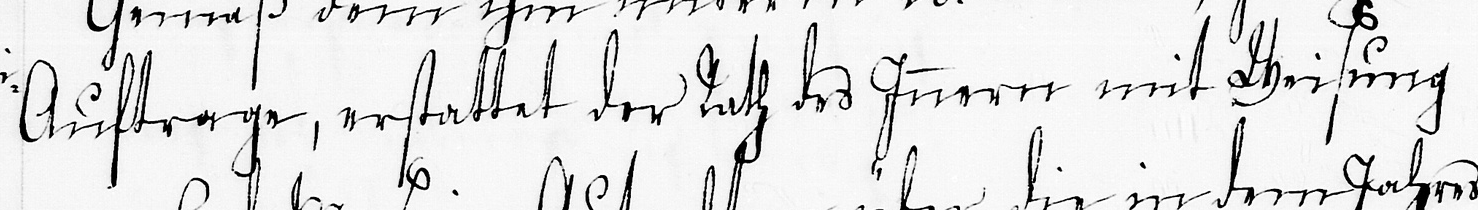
Auftrage, erstattet der Rath des Innern mit Weisung
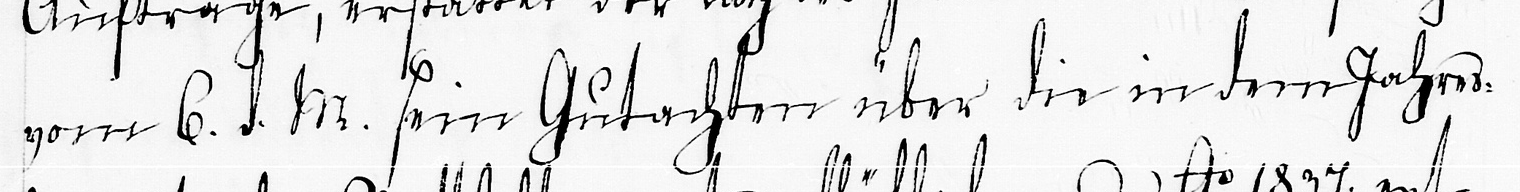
vom 6. d. M. sein Gutachten über die in dem Jahres¬
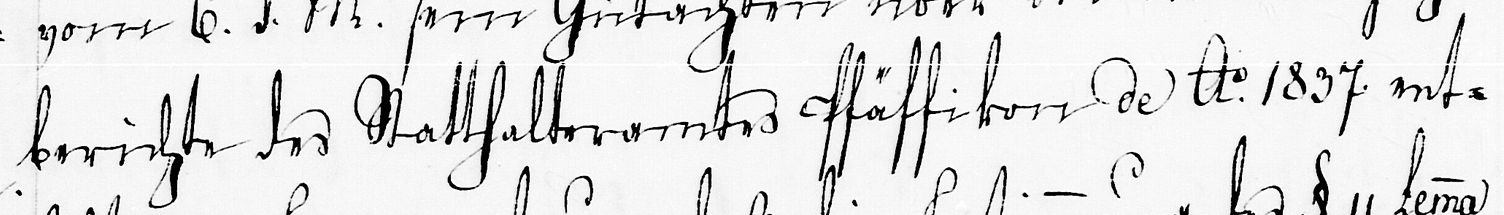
berichte des Statthalteramtes Pfäffikon de A.o 1837. ent¬
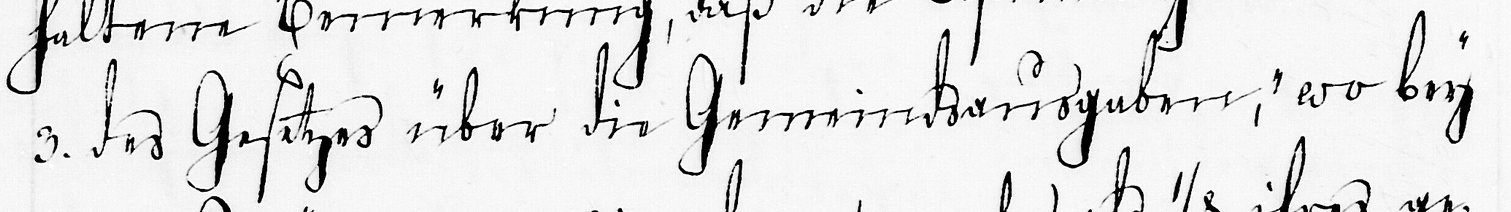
3. des Gesetzes über die Gemeindsausgaben, „wo bey
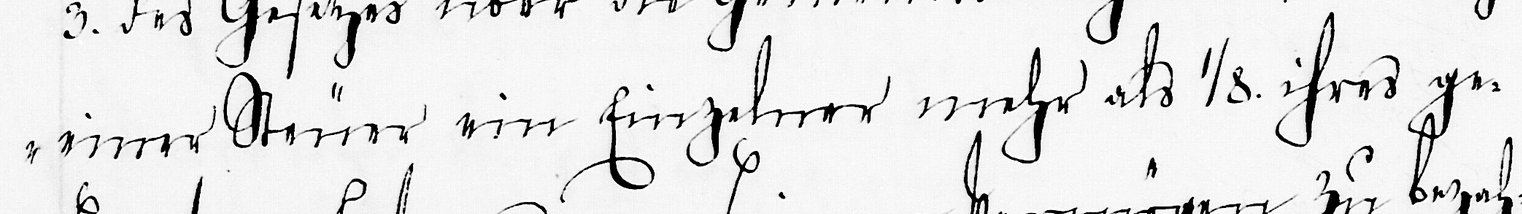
einer Steuer ein Einzelner mehr als 1/8. ihres ge¬
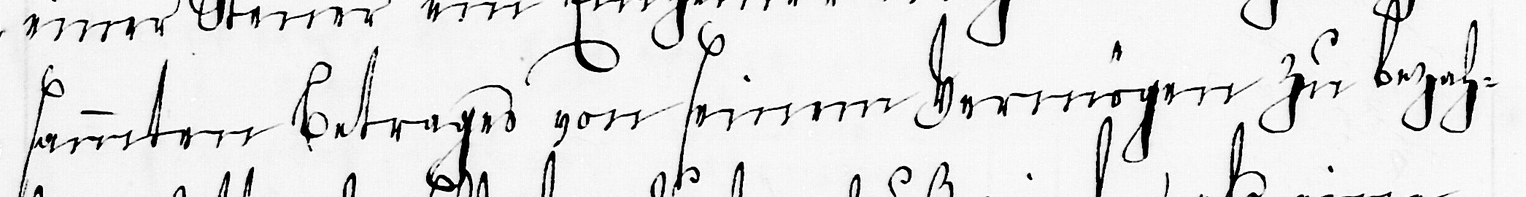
sammten Betrages von seinem Vermögen zu bezah¬
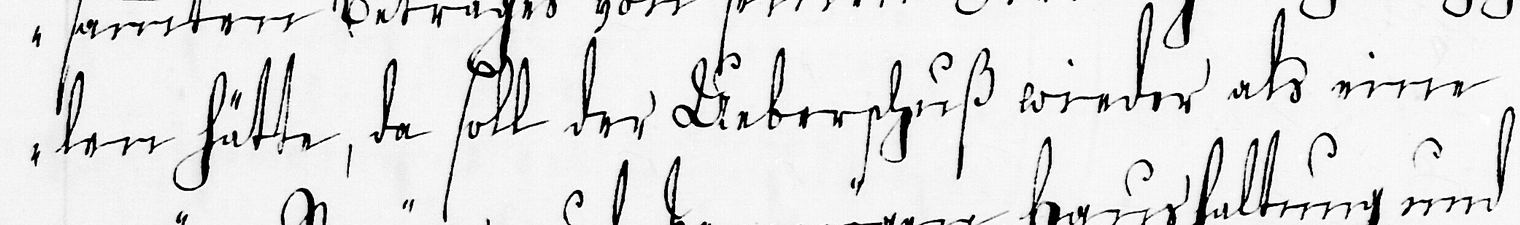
len hätte, da soll der Ueberschuß wieder als eine
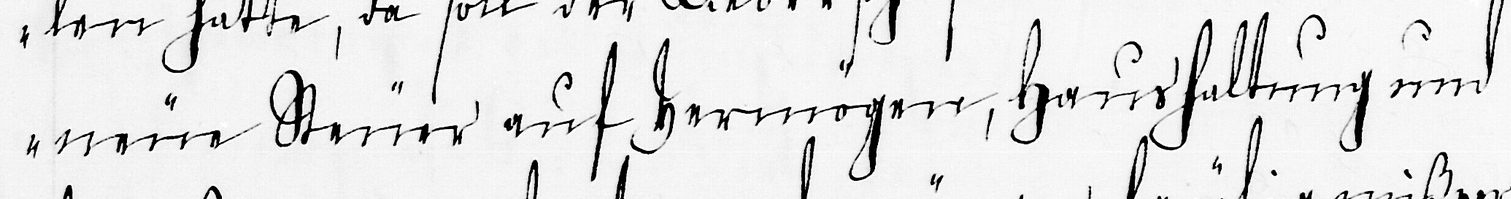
neue Steuer auf Vermögen, Haushaltung und
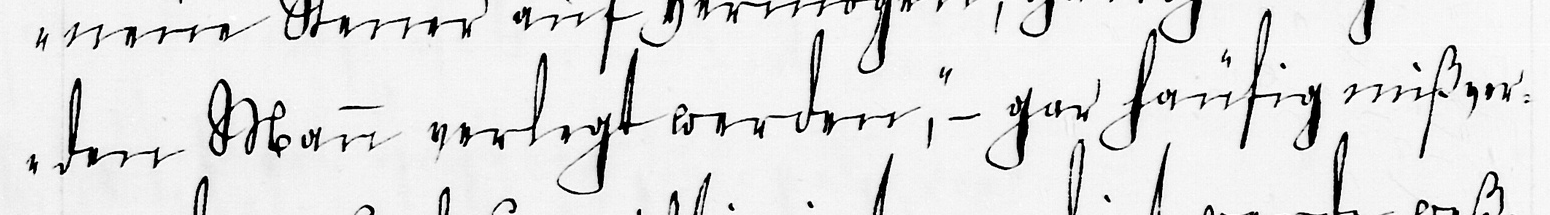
den Mann verlegt werden,“ – gar häufig mißver¬
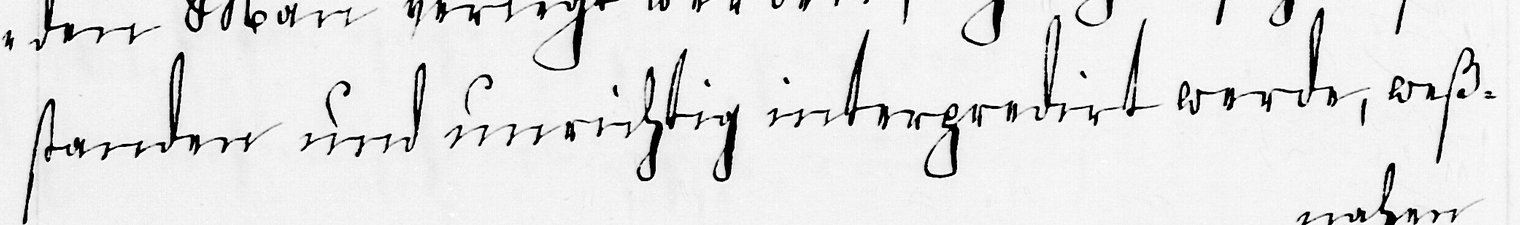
standen und unrichtig interpredirt werde, weß-
